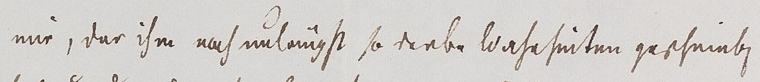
mir, der ihm noch unlängst so derbe Wahrheiten geschrieben
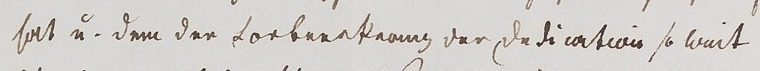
hat u. dem der Lorbeerkranz der Dedication so weit
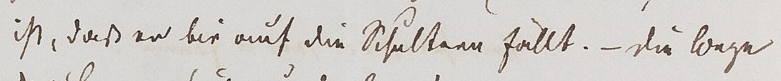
ist, daß er bis auf die Schultern fällt. – Die Wege
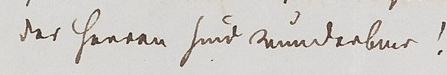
des Herrn sind wunderbar!
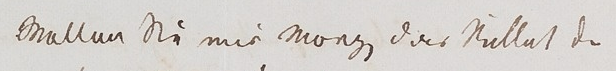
Wollen Sie mir morgen das Billet des
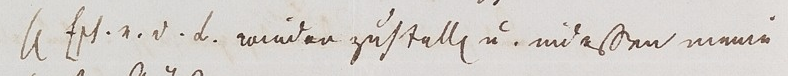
H. Esch. v. d. L. wieder zustellen u. indessen meine
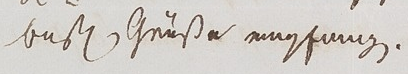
besten Grüße empfangen.
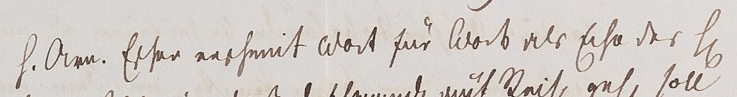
H. Arn. Escher erscheint Wort für Wort als Echo des H
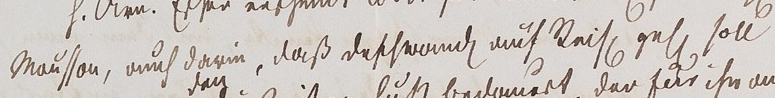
Mousson, auch darin, daß Deschwanden auf Reisen gehen soll
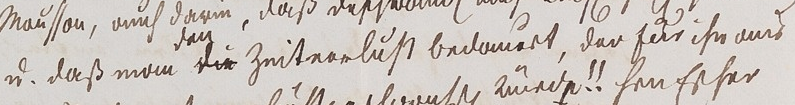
u. daß man dieden Zeitverlust bedauert, das für ihn aus
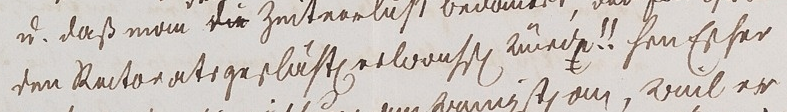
den Rectoratsgeschäften erwachsen würde!! Hrn Escher
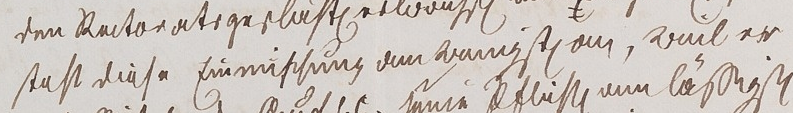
steht diese Einmischung am wenigstens an, weil er
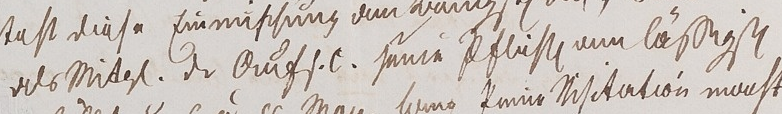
als Mitgl. der Aufs.C. seine Pflichten am lässigsten
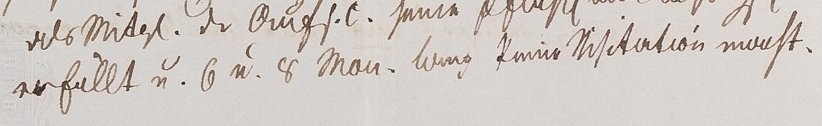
erfüllt u. 6 u. 8 Mon. lang keine Visitation macht.
